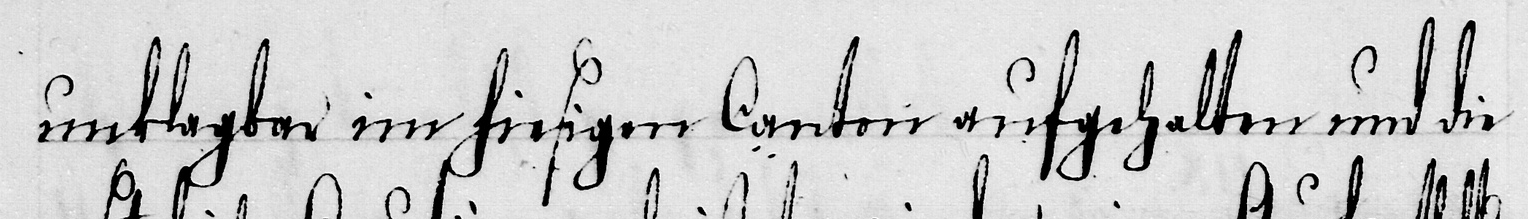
unklagbar im hiesigen Canton aufgehalten und die
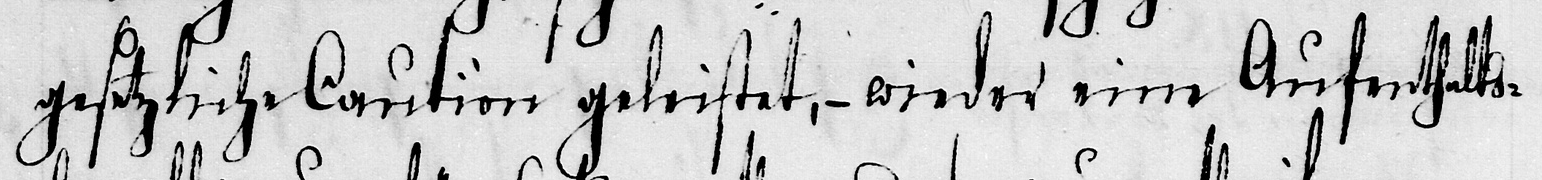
gesetzliche Caution geleistet, – wieder eine Aufenthalts¬
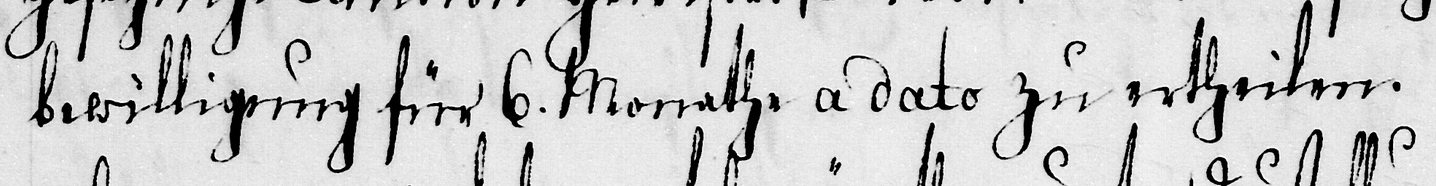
bewilligung für 6. Monathe a dato zu ertheilen.
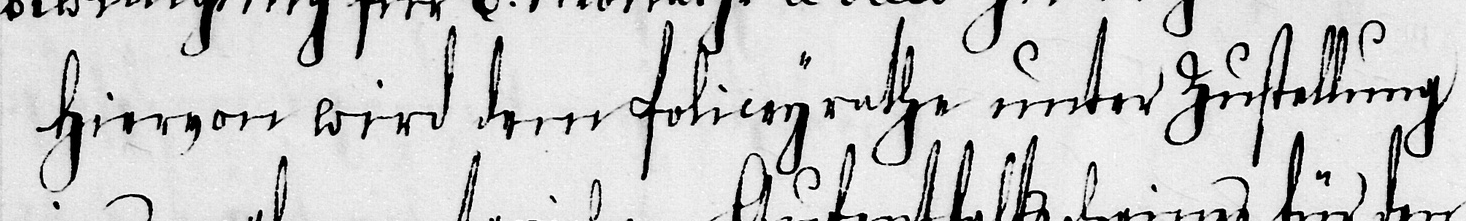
Hiervon wird dem Policeyrathe unter Zustellung
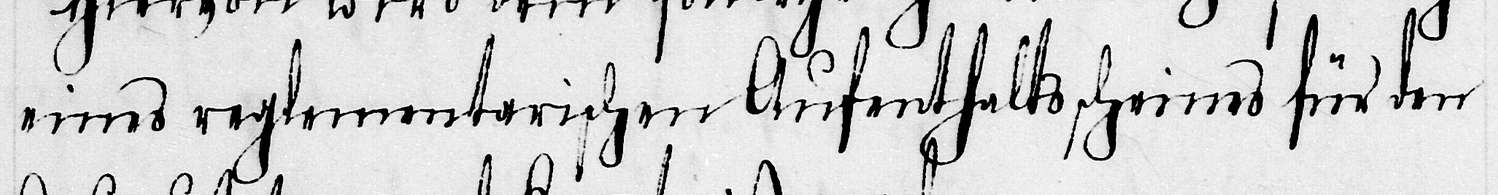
eines reglementarischen Aufenthaltsscheines für den
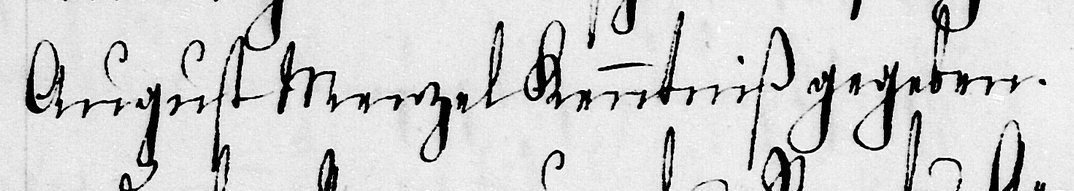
August Menzel Kenntniß gegeben.
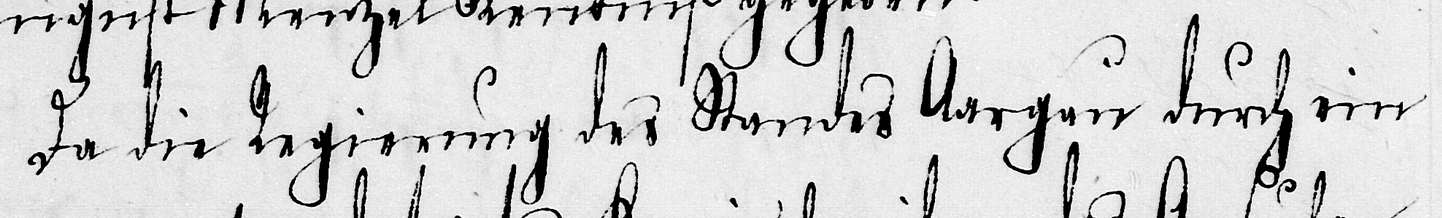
Da die Regierung des Standes Aargau durch ein
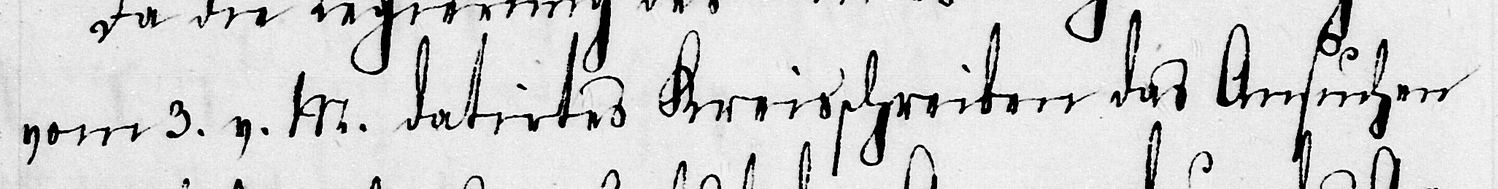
vom 3. v. M. datirtes Kreisschreiben das Ansuchen
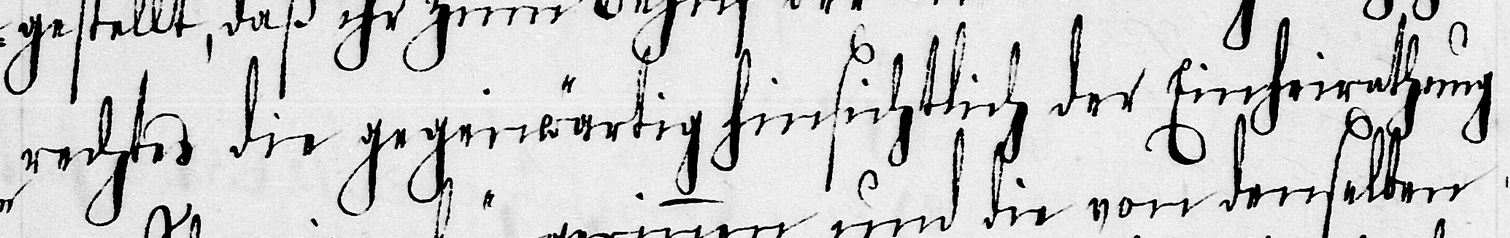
rechtes die gegenwärtig hinsichtlich der Einheirathung
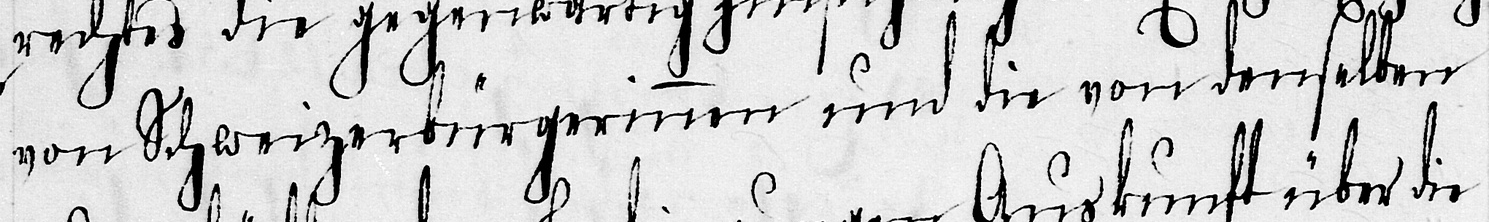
von Schweizerbürgerinnen und die von denselben
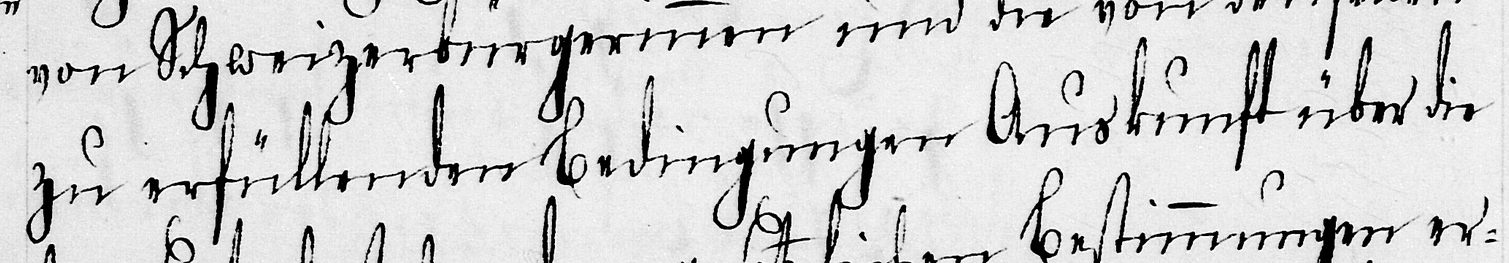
zu erfüllenden Bedingungen Auskunft über die
